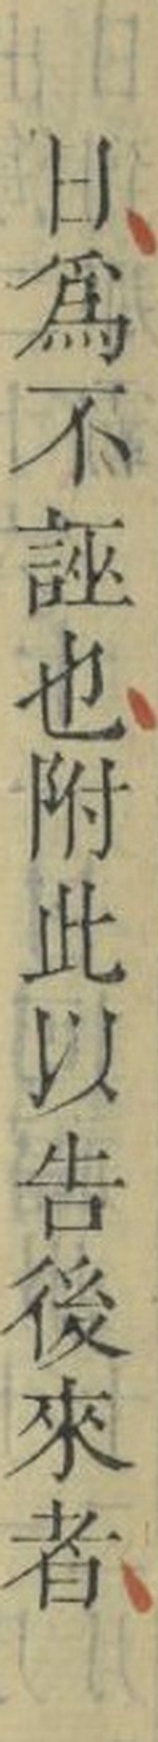日爲不誣也附此以告後來者
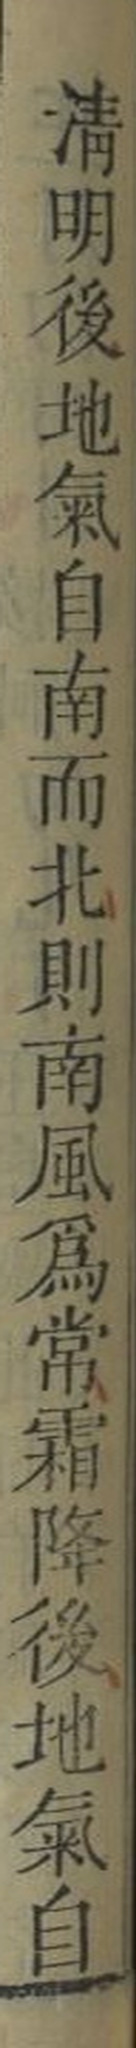淸明後地氣自南而北則南風爲常霜降後地氣自
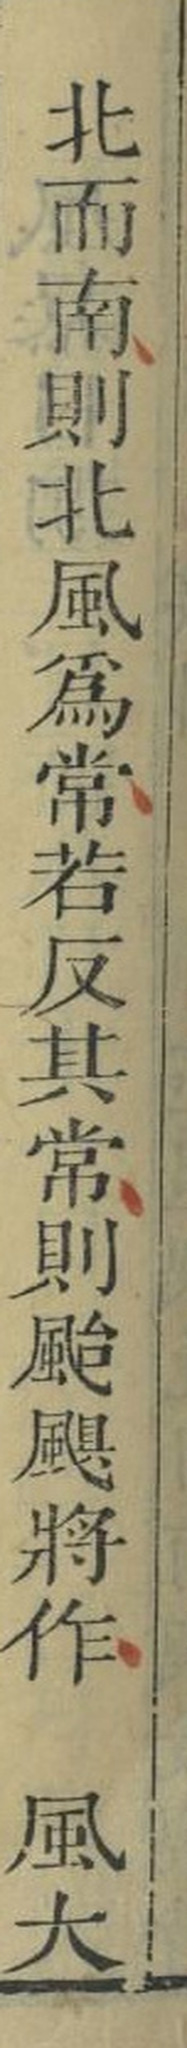北而南則北風爲常若反其常則颱颶將作風大
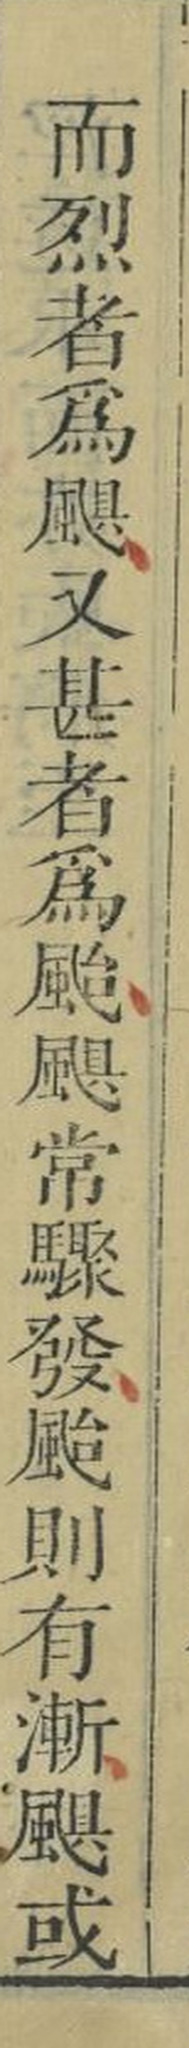而烈者爲颶又甚者爲颱颶常驟發颱則有漸颶或
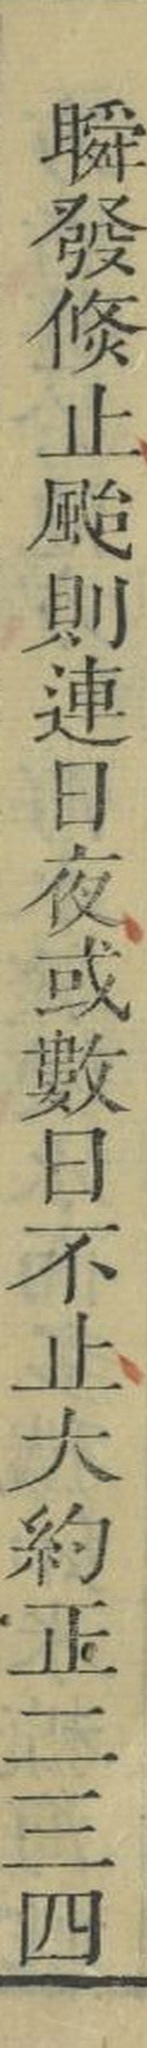瞬發焂止颱則連日夜或數日不止大約正二三四
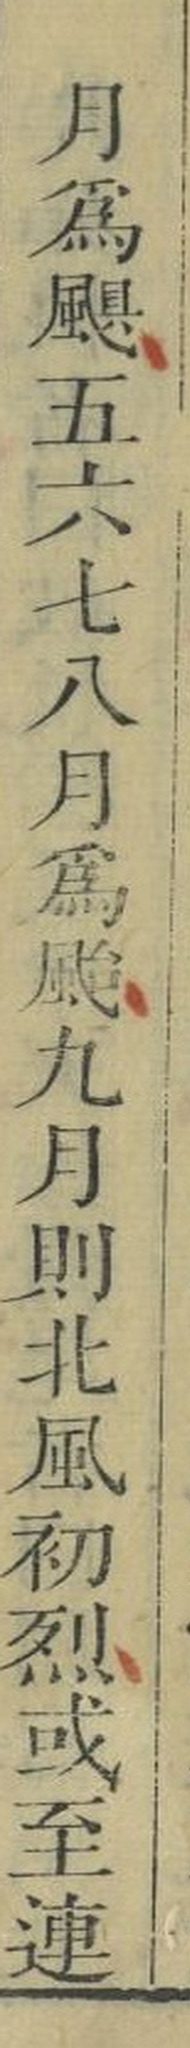月爲颶五六七八月爲颱九月則北風初烈或至連
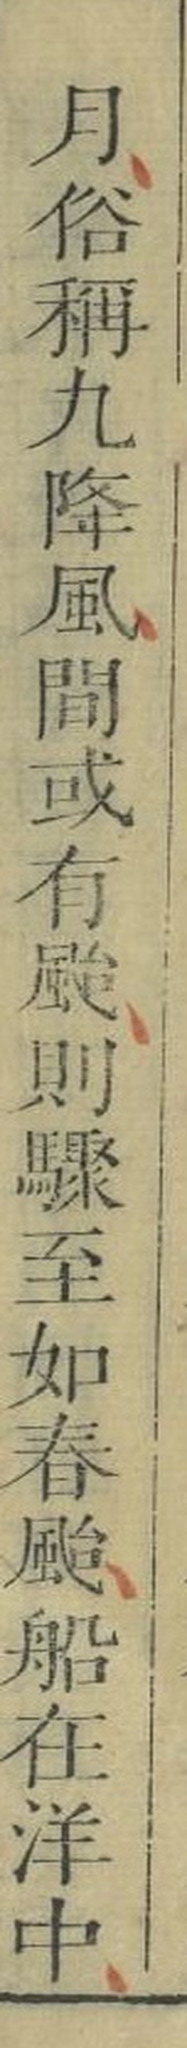月俗稱九降風間或有颱則驟至如春颱船在洋中
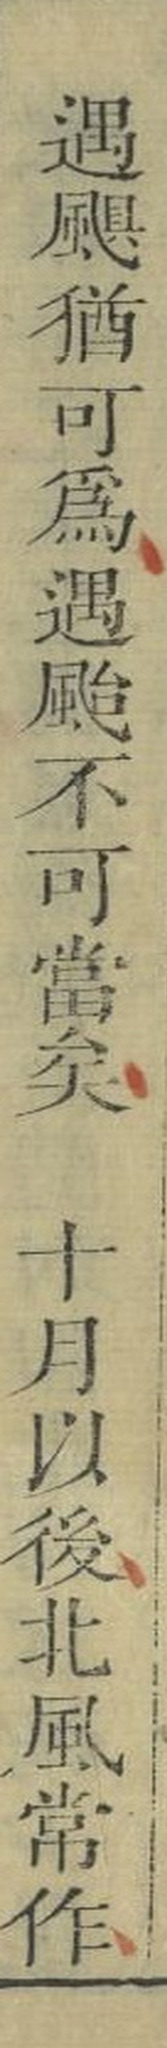遇颶猶可爲遇颱不可當矣十月以後北風常作
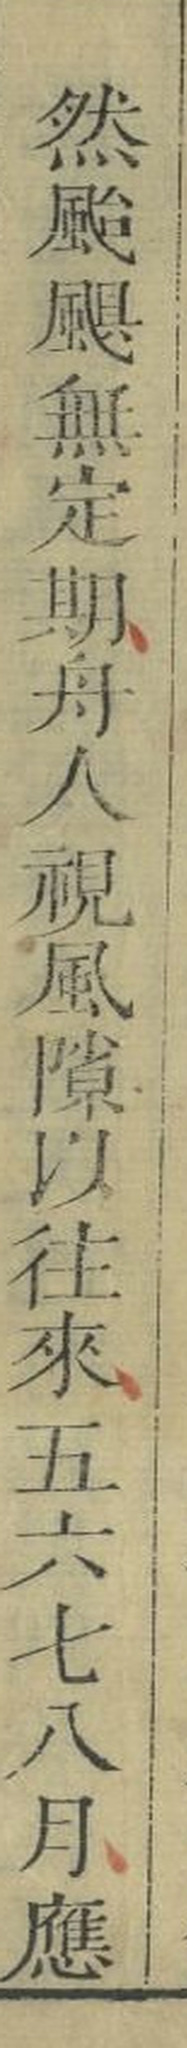然颱颶無定期舟人視風隙以往來五六七八月應
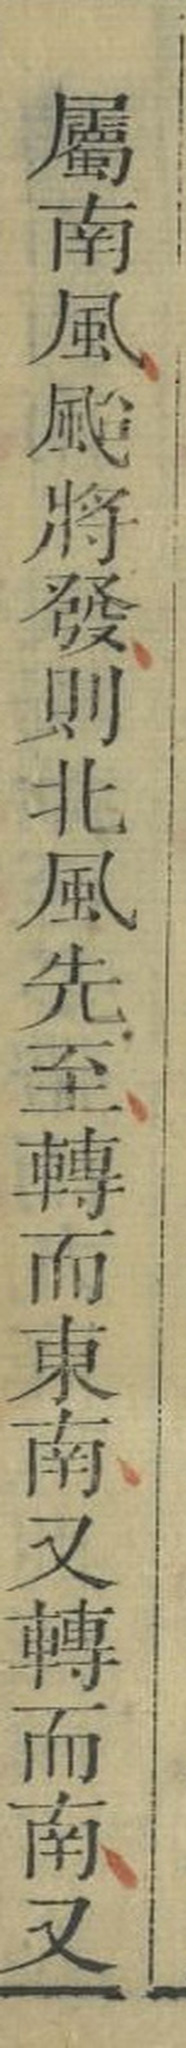屬南風颱將發則北風先至轉而東南又轉而南又

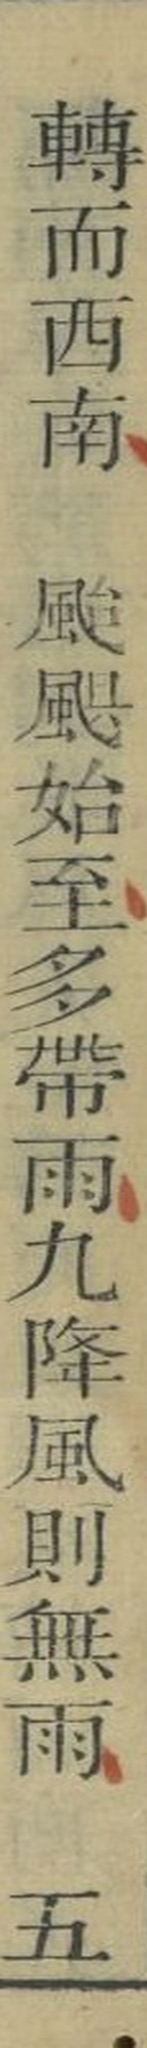轉而西南颱颶始至多帶雨九降風則無雨五
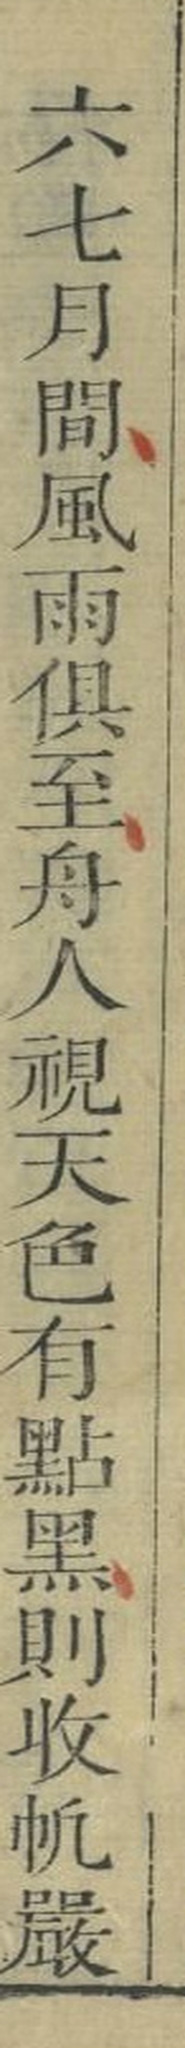六七月間風雨俱至舟人視天色有點黑則收帆嚴
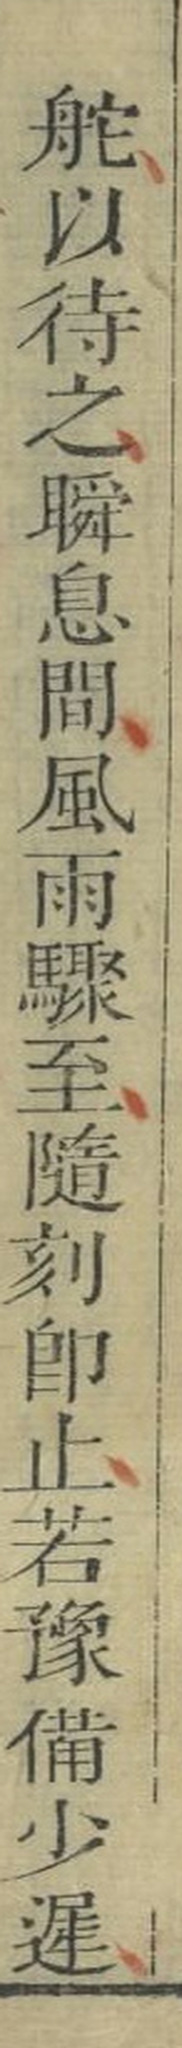舵以待之瞬息間風雨驟至隨刻卽止若豫備少遲
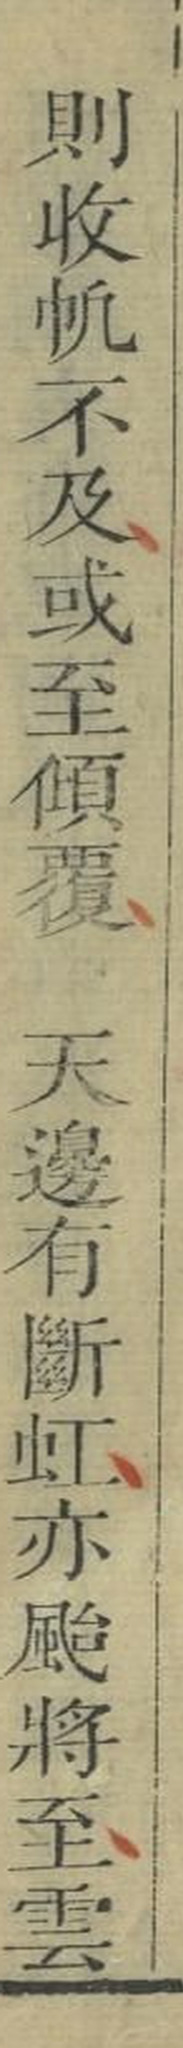則收帆不及或至傾覆天邊有斷虹亦颱將至雲
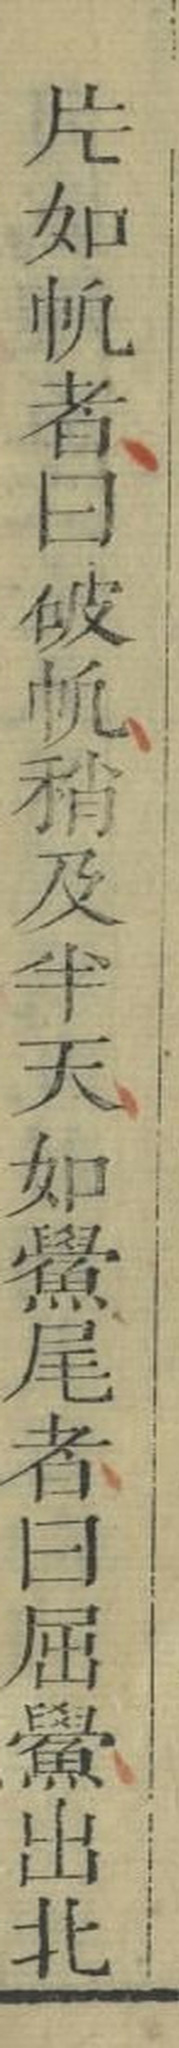片如帆者曰破帆稍及半天如鱟尾者曰屈鱟出北
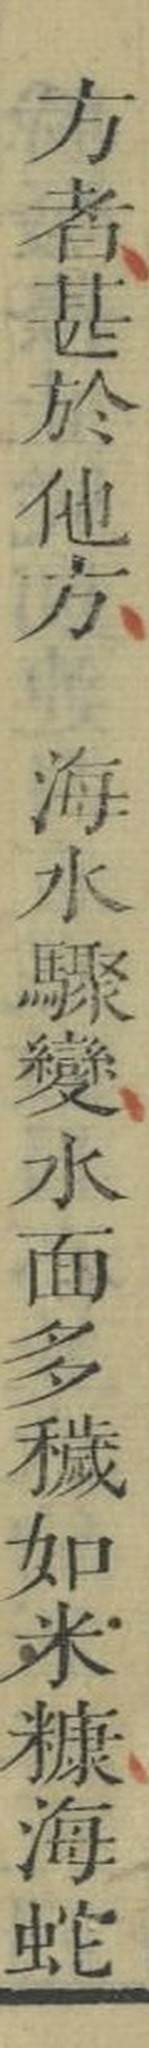方者甚於他方海水驟變水面多穢如米糠海蛇
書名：中山伝信録 巻一、巻二
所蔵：University of the Ryukyus Library
